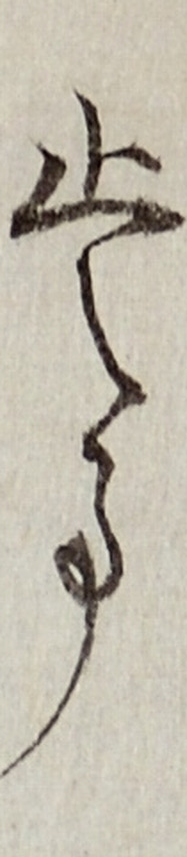止之事
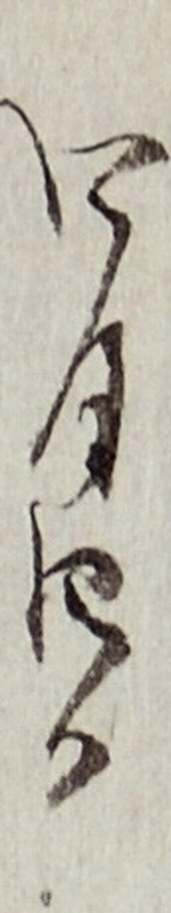四月四日
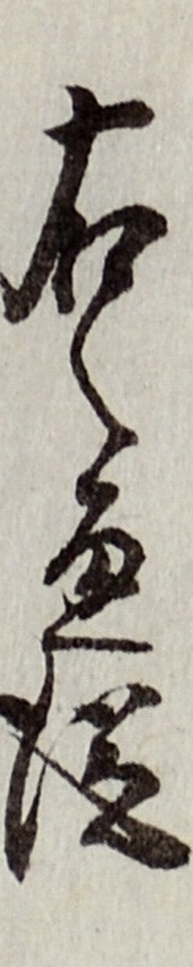右之通従
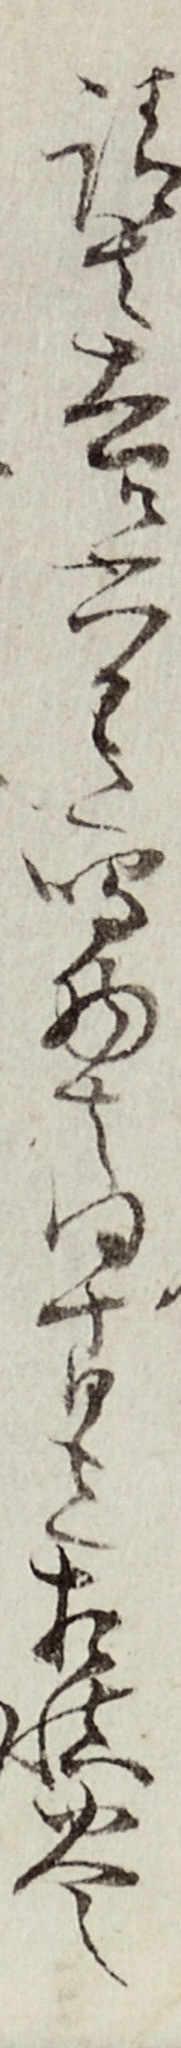請者去ル六日迄鳴物者同十日迄相慎火之
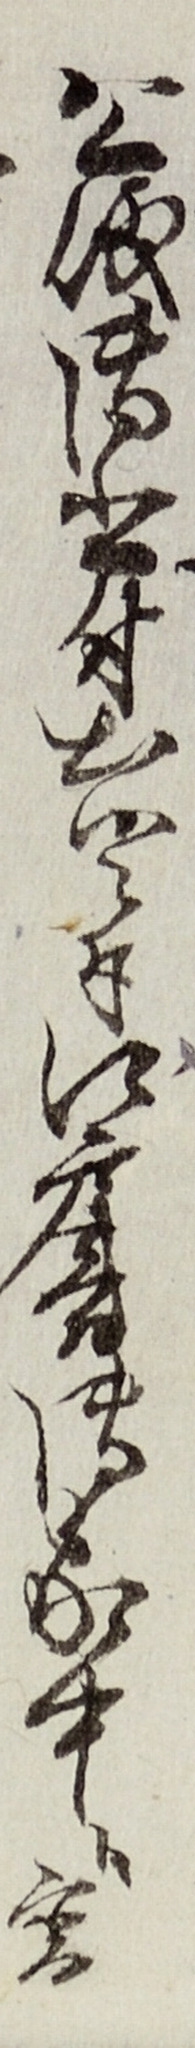公儀御書付出候ニ付江戸表御家中江普
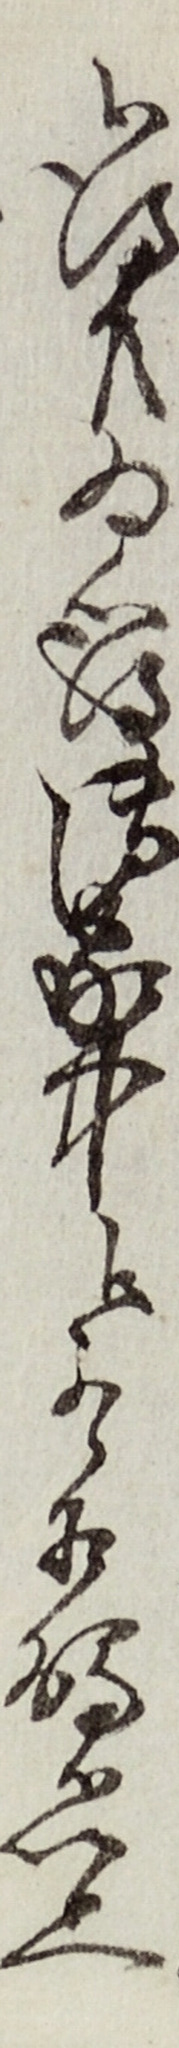候得共為心得御家中江可被相触候以上
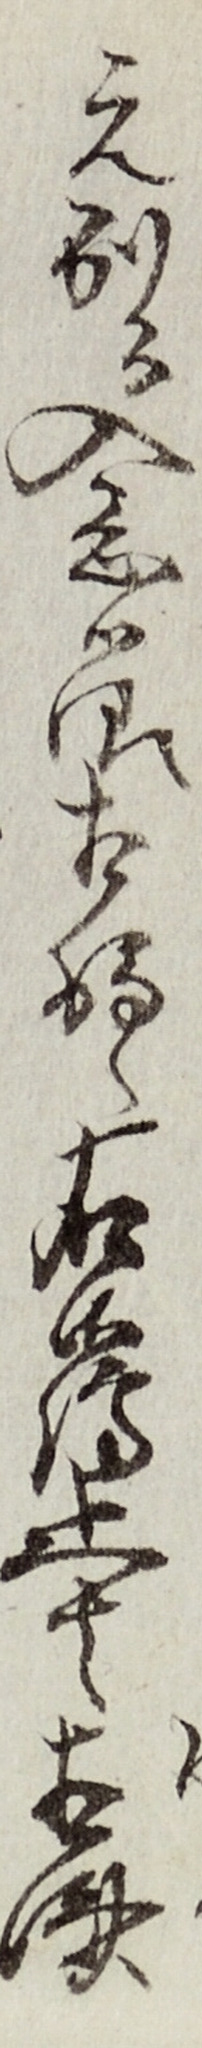元別而入念候様相触候右御停止者相済
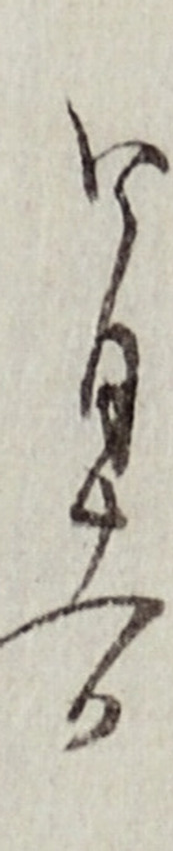四月十一日
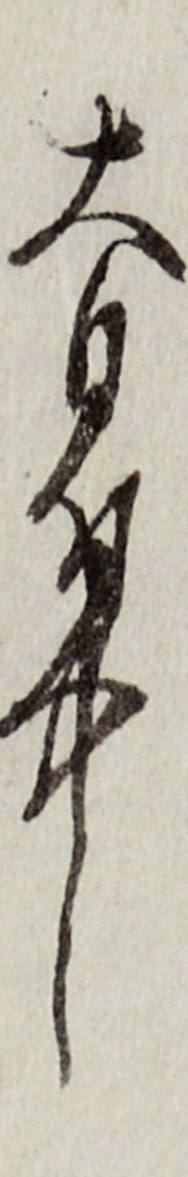大目付中
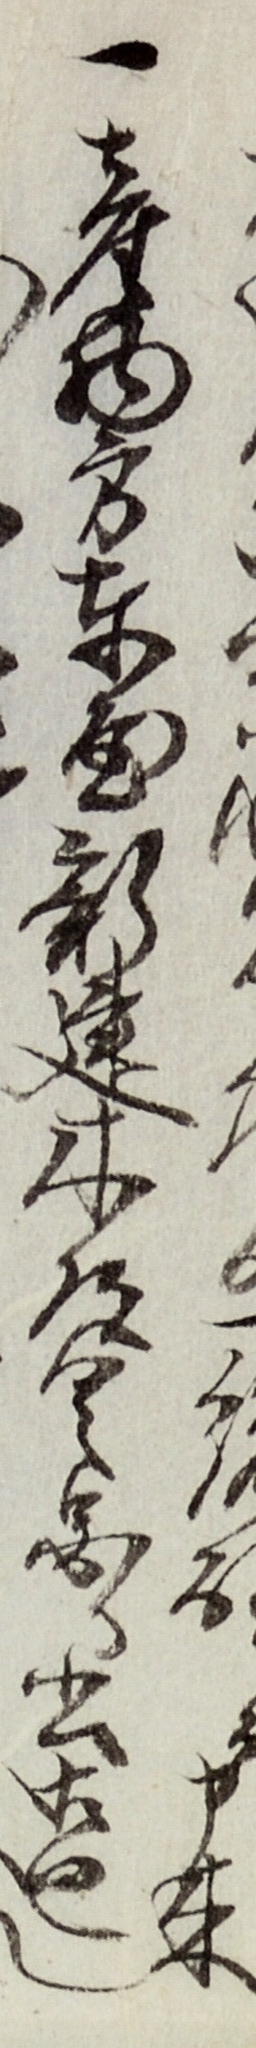一産物方車屋新建木道具図り書相廻し
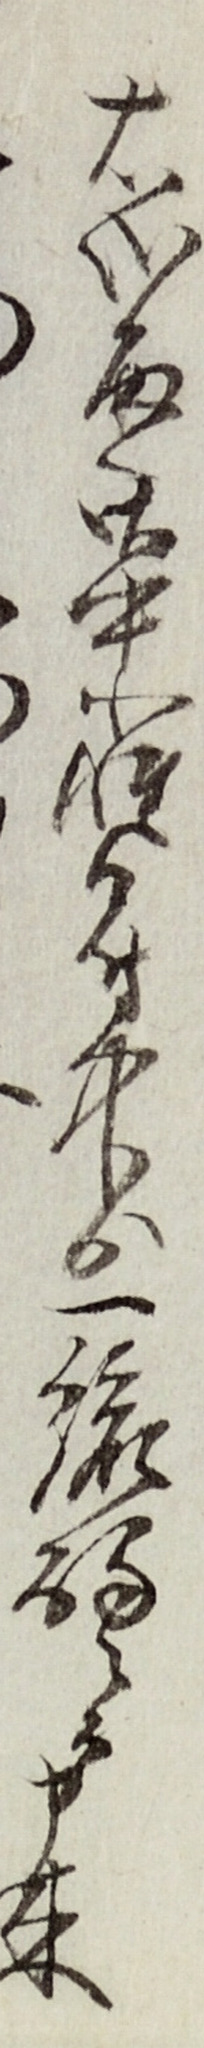右弐通御中小性目付中ゟ一統触ニ而申来
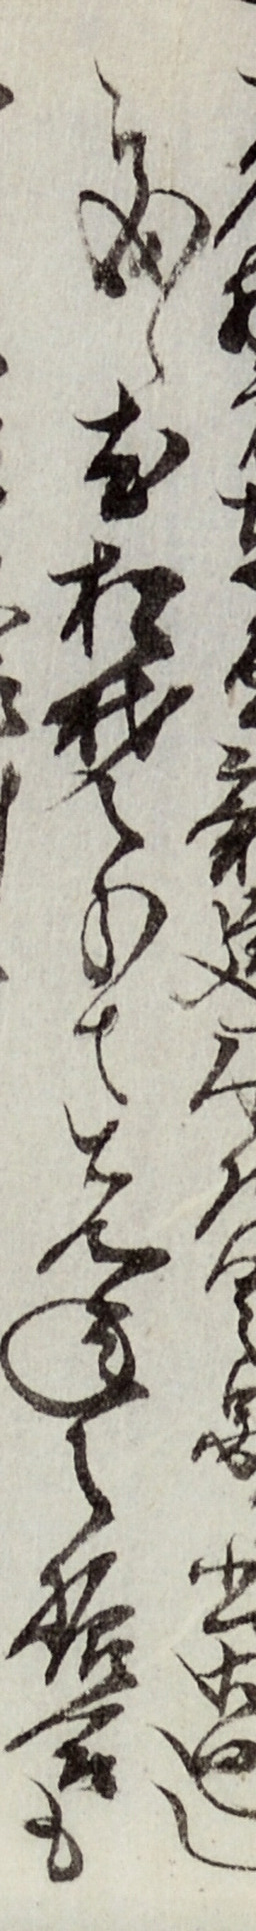被成候尤松材之分者先年之振合も
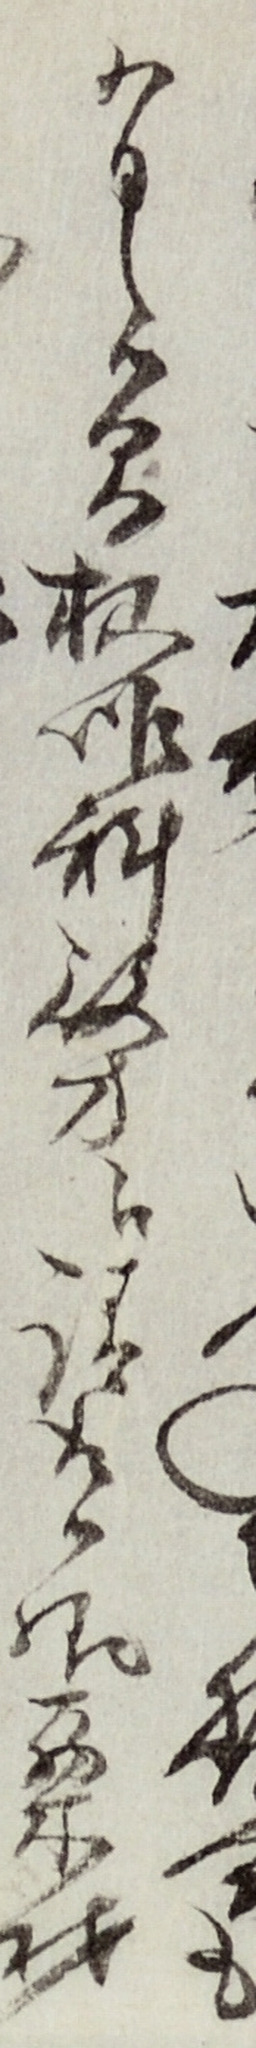有之候間杣作料役方江請取候様栗材
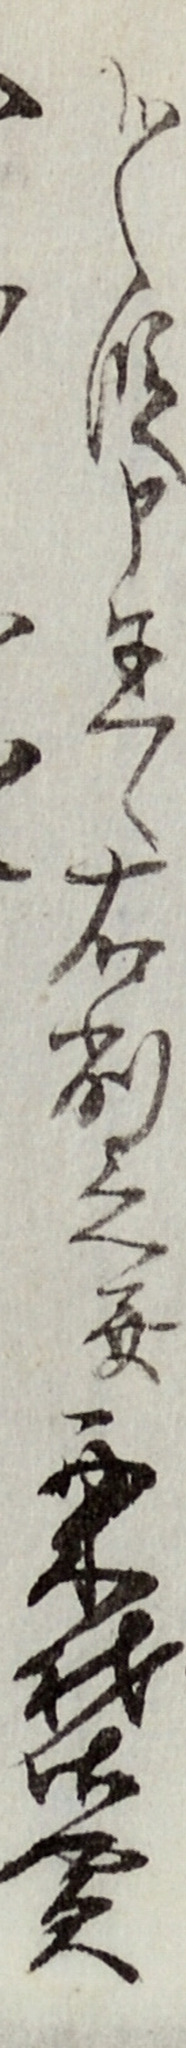候之段申達候右削立并栗材御買
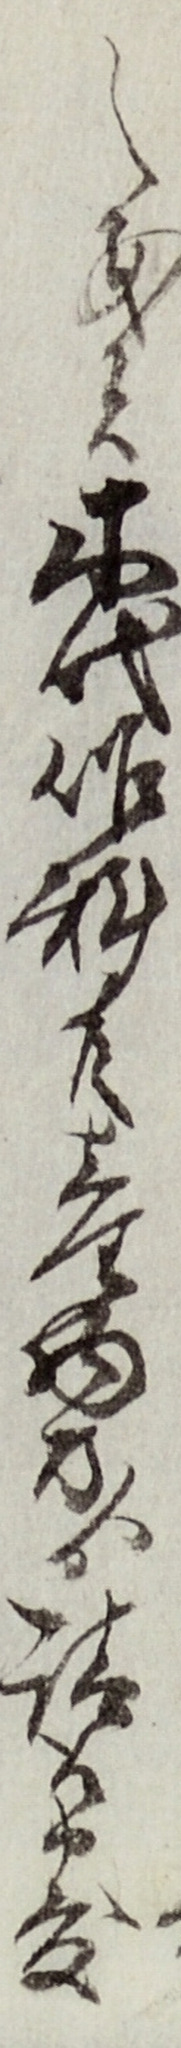之義者木代作料共産物方ゟ請取申度
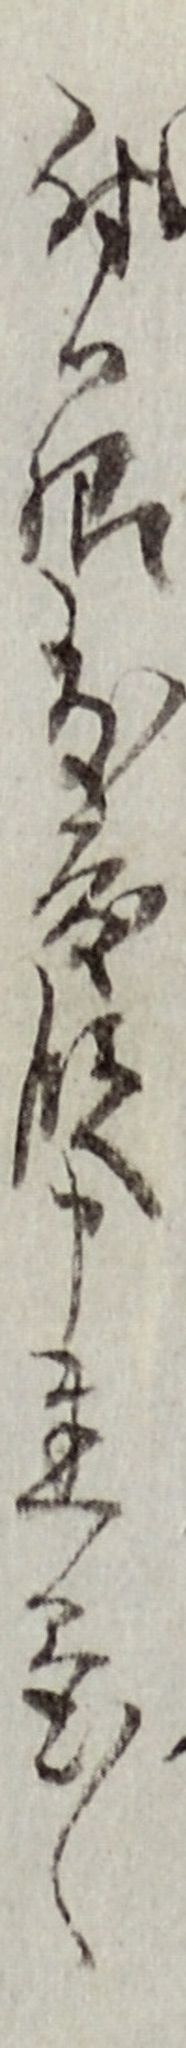付候様致度段申達置候
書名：御山方御薪方諸事御用留
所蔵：伊那市立高遠町図書館・合同会社AMANE
